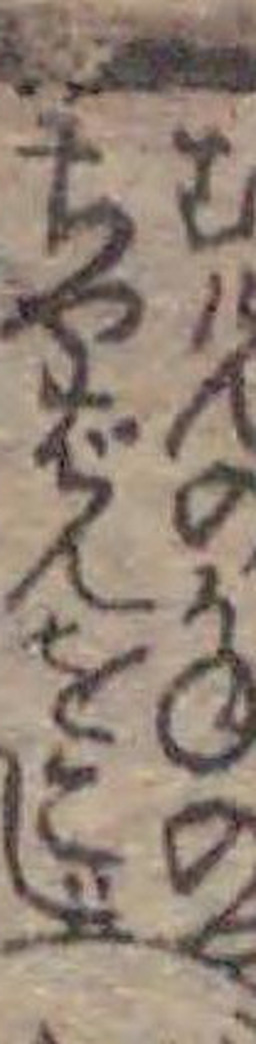ちやばんをこじ
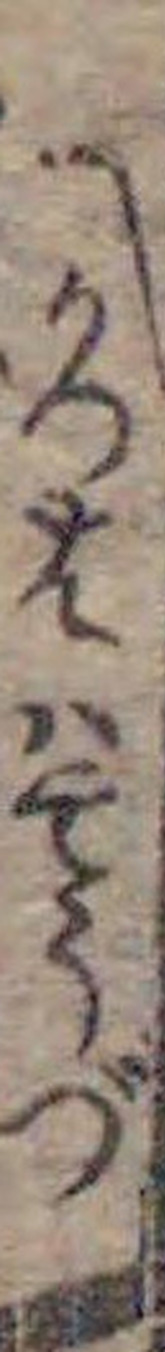〽かつははてうづ
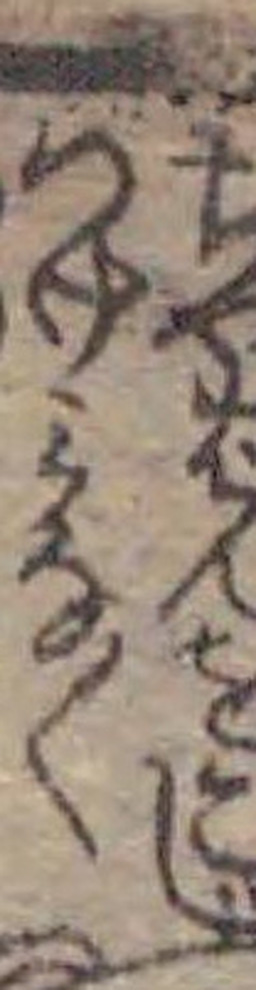つけみな〳〵
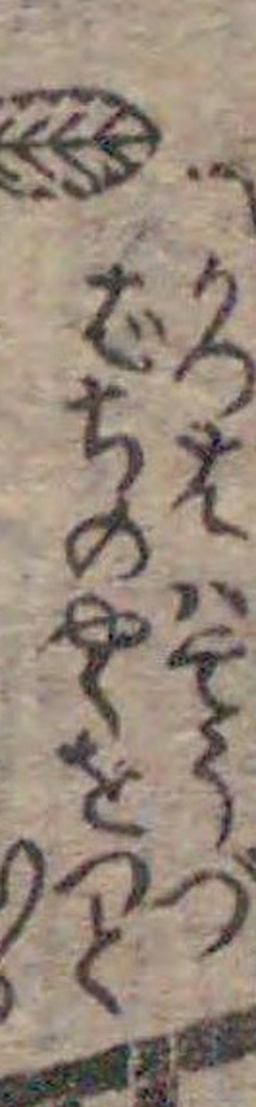はちのやくをつと
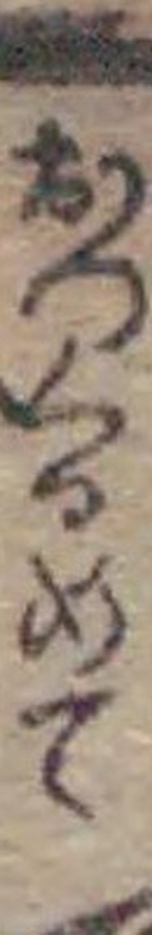おつくるめて
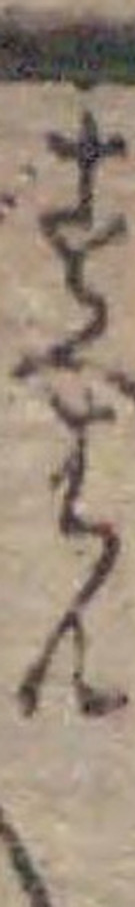すへはん
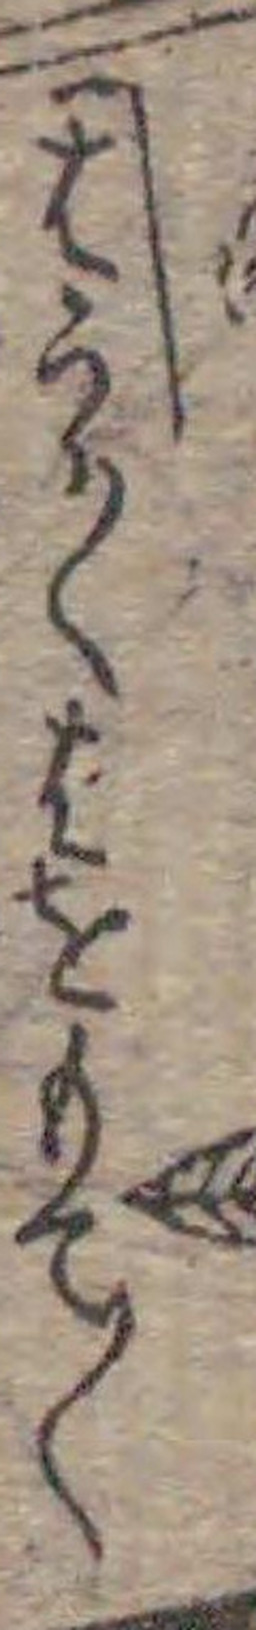〽はうら〳〵はおもて〳〵
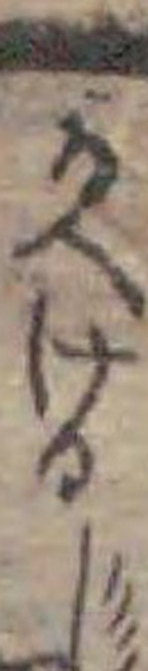かへける
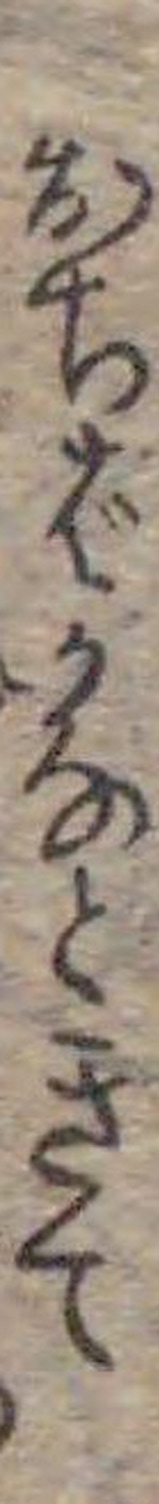おちばかなときて
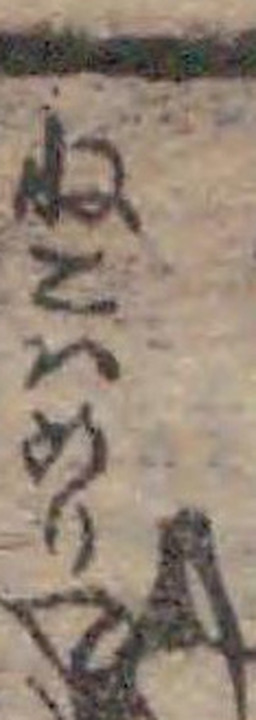ねこはめり
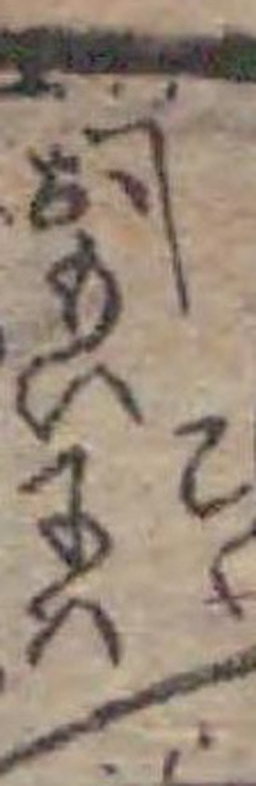〽おもいには
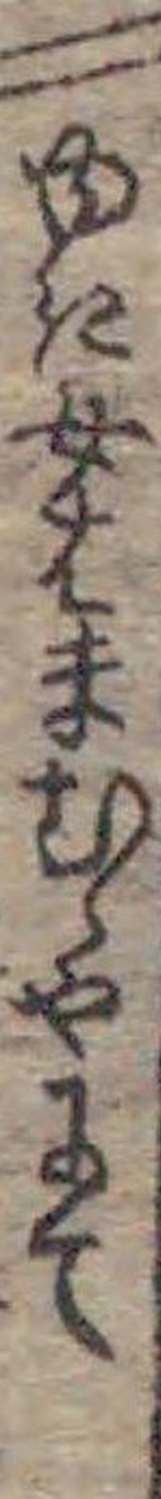ゆき女ははむらやにて
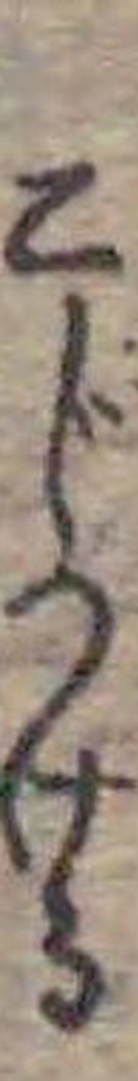こじつける
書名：化物楽屋異牒 : 2巻
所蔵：国立国会図書館 National Diet Library, JAPAN
